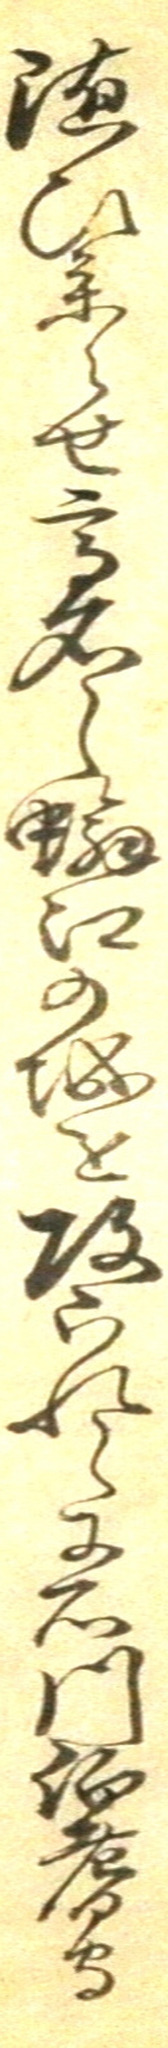随ひ参らせ高名し蟹江の城を攻られしに石川伯耆守
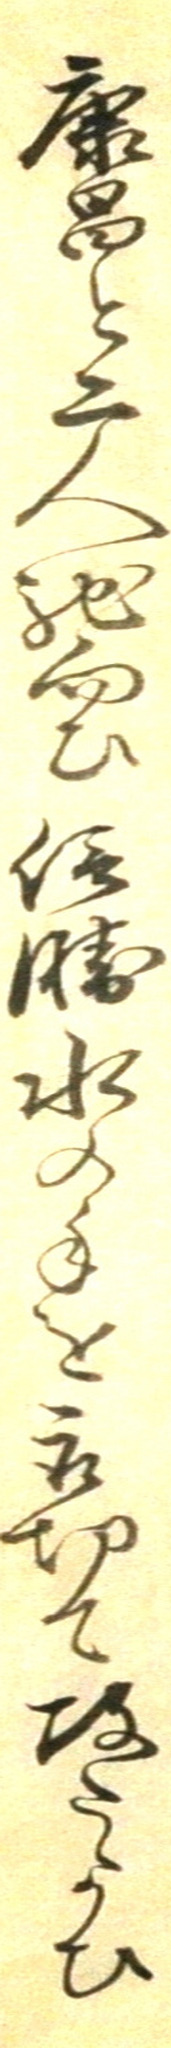康昌と二人馳向ひ信勝水の手を取切て攻たゝかひ
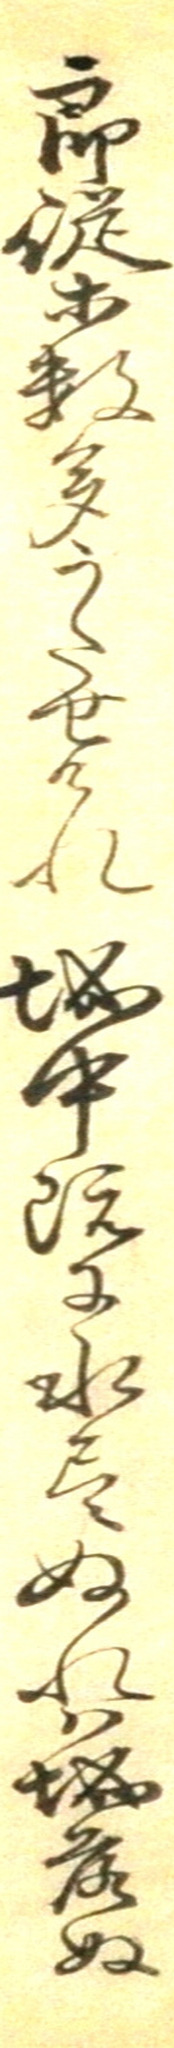郎従等数多うたせけれ城中既に水尽ぬれは城落ぬ
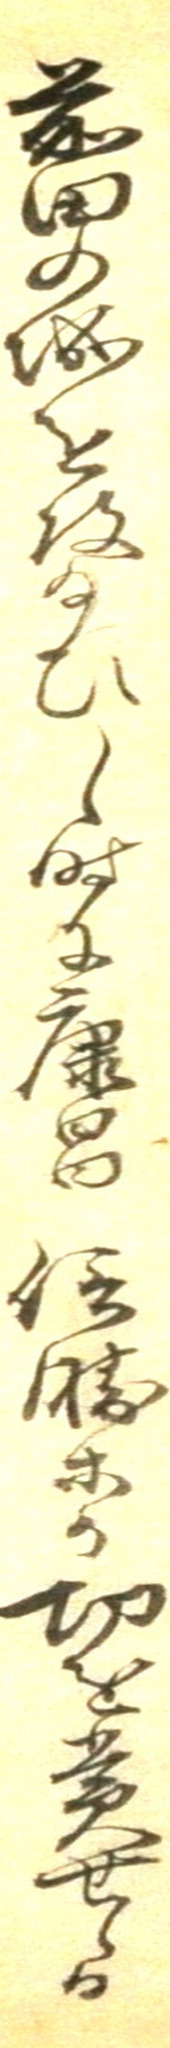前田の城を攻給ひし時に康昌信勝等か功を賞せらる
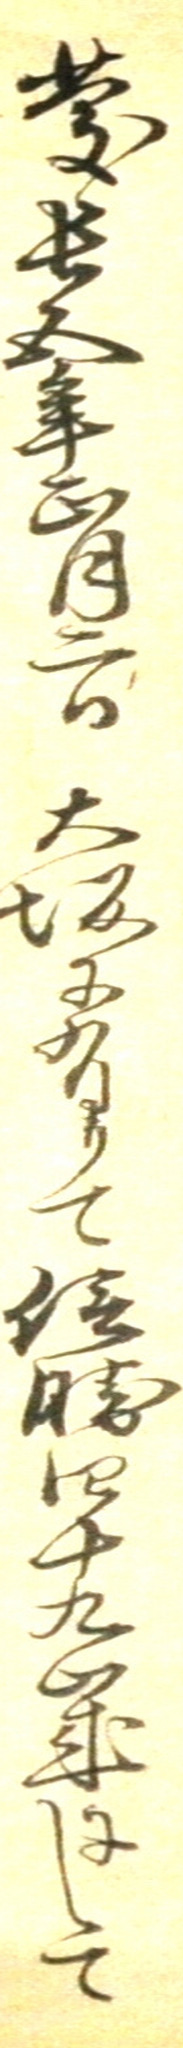慶長五年正月二日大坂に有りて信勝四十九歳にして
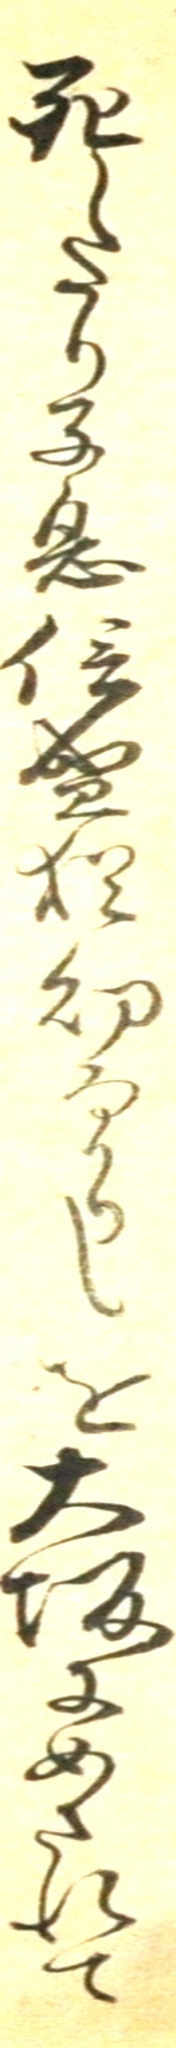死したり子息信盛猶幼なかりしを大坂にめされて
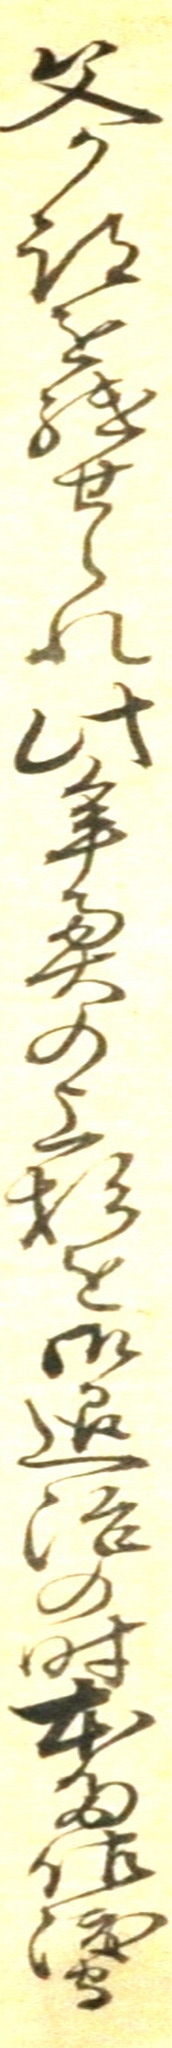父か跡を継せられ此年奥の上杉を御退治の時本多佐渡守
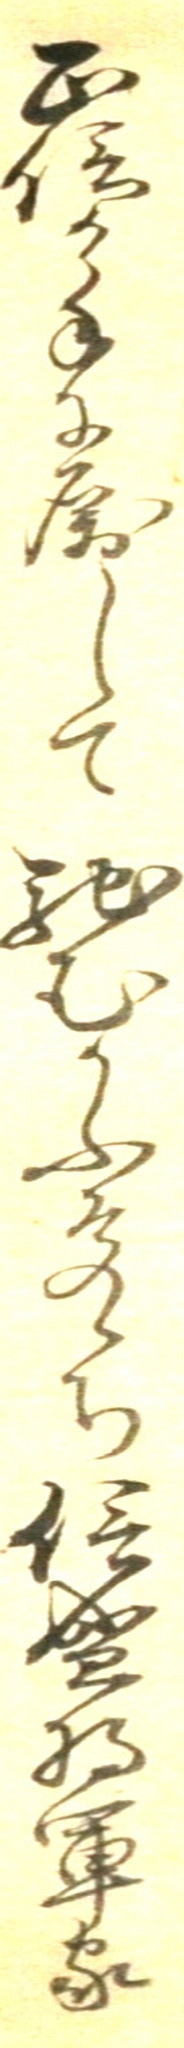正信か手に属して馳むかふそのゝち信盛将軍家
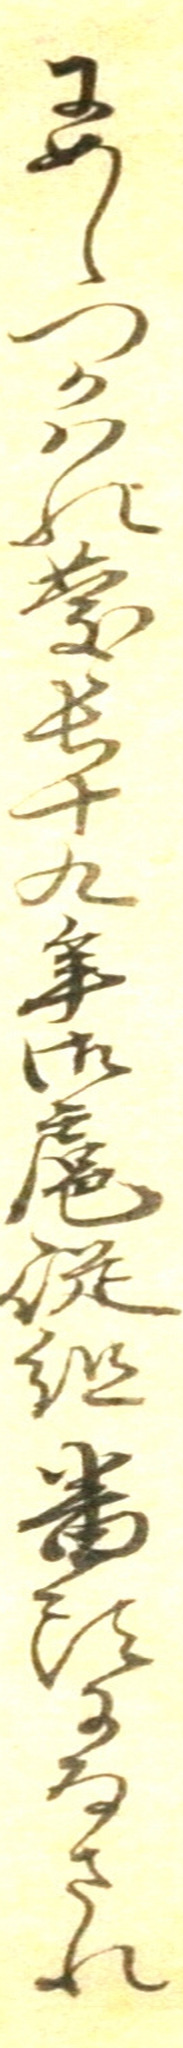にめしつかはれ慶長十九年御扈従組番頭になされ
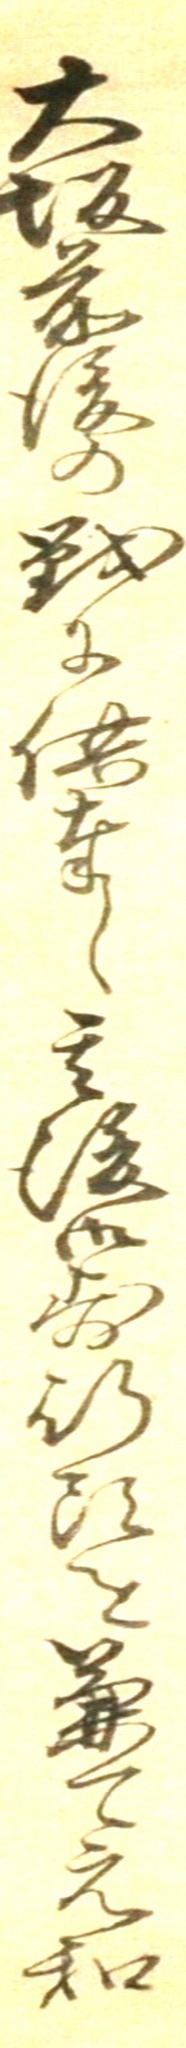大坂前後の戦に供奉し其後御歩行頭を兼て元和
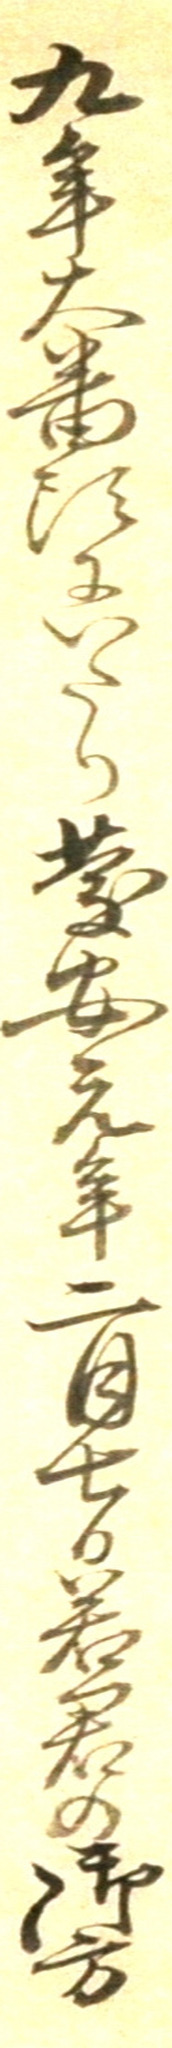九年大番頭にいたり慶安元年二月七日若君の御方
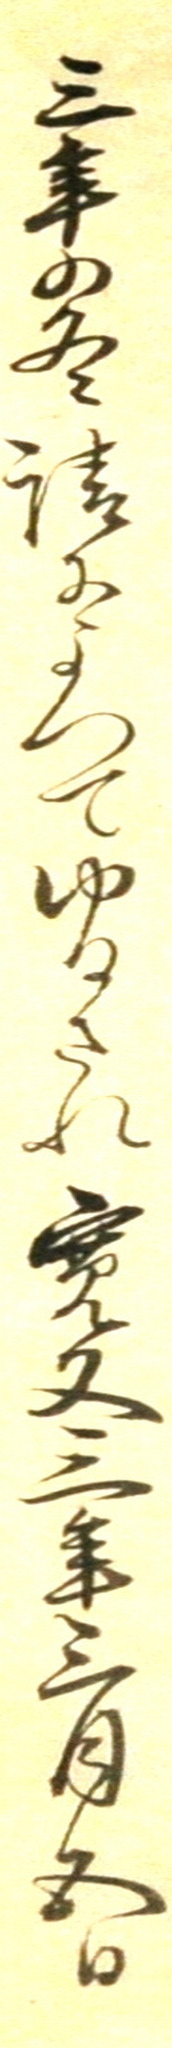三年の冬請によつてゆるされ寛文三年三月五日
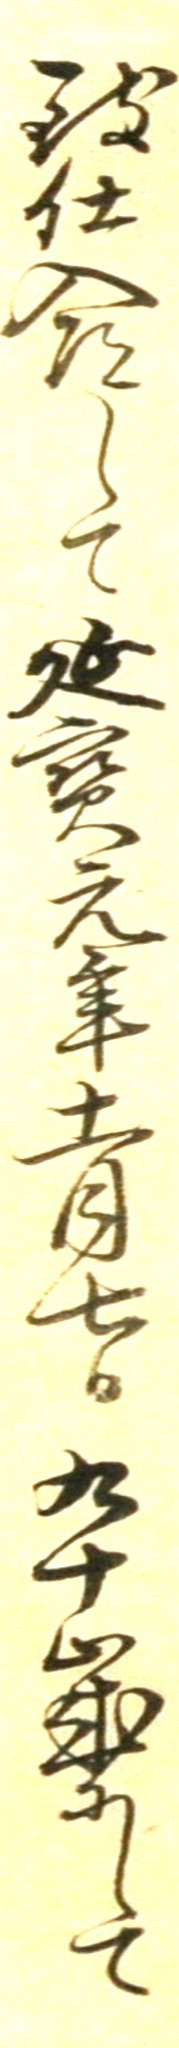致仕入道して延宝元年十一月七日九十歳にして

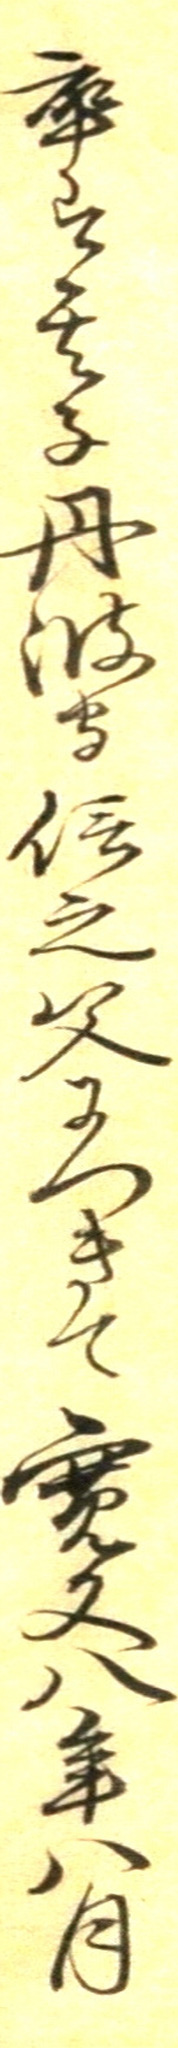卒す其子丹波守信之父につきて寛文八年八月
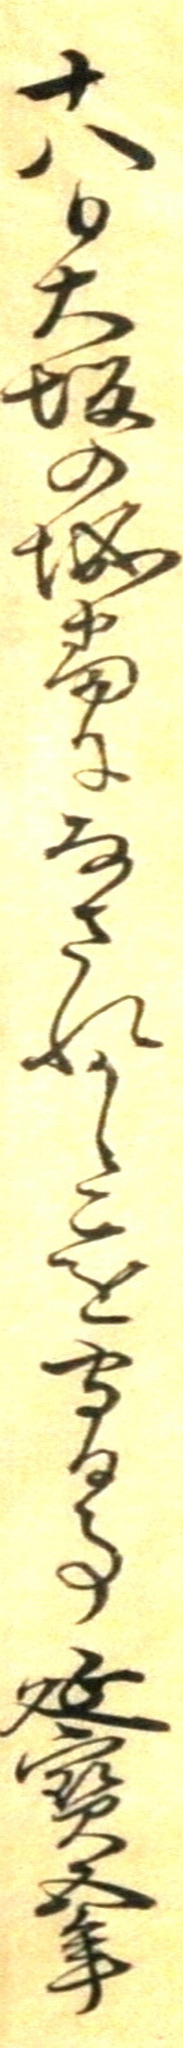十八日大坂の城番になされかしこを守る事延宝五年
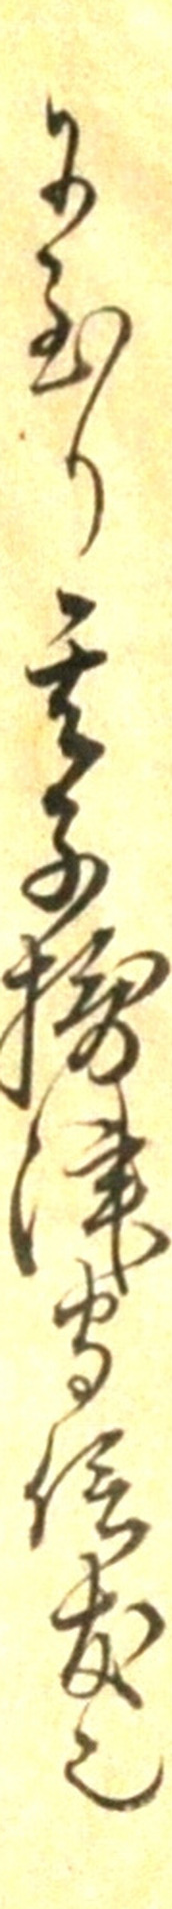に至り其子摂津守信友也
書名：藩翰譜（四・中）
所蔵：伊那市立高遠町図書館・合同会社AMANE
